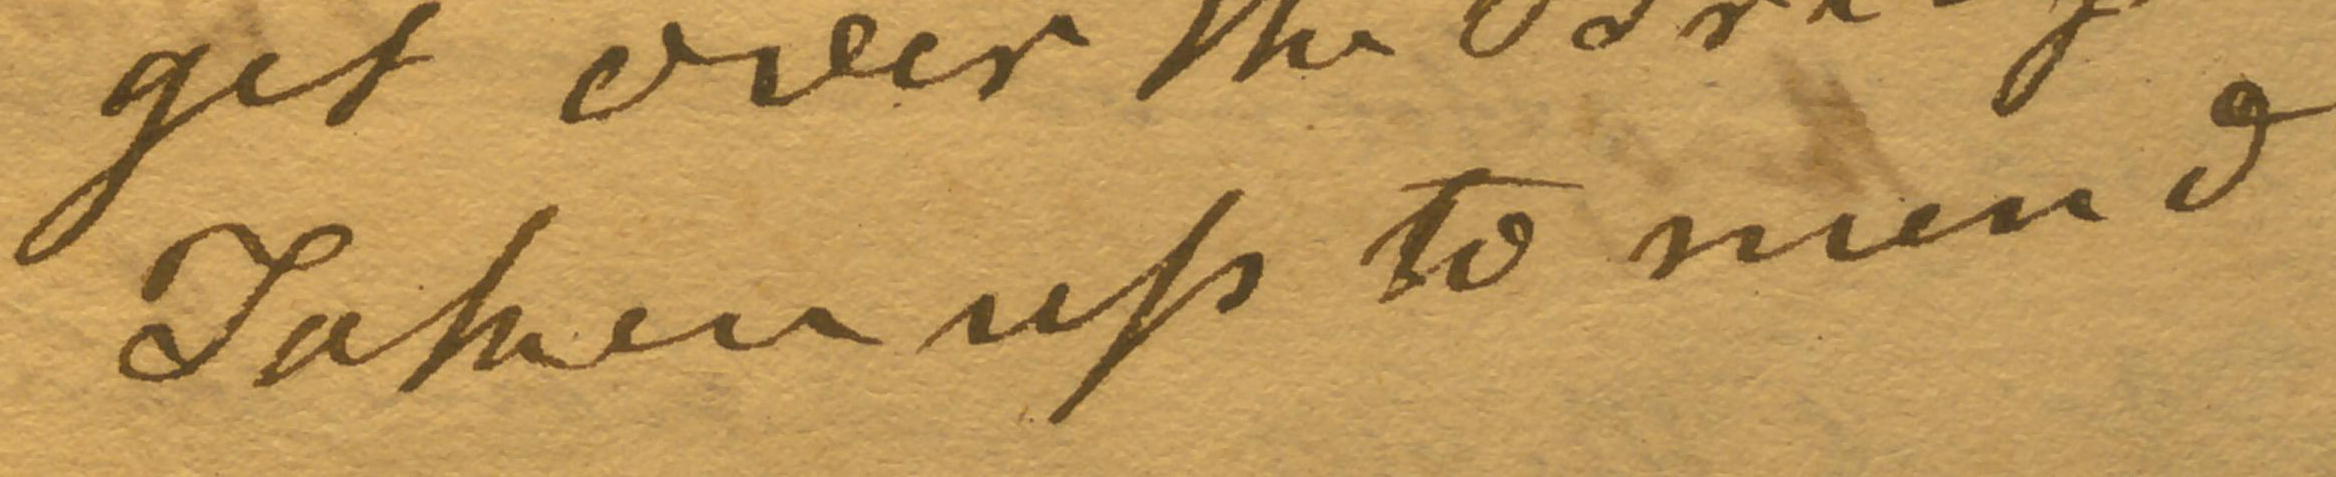Taken up to mend
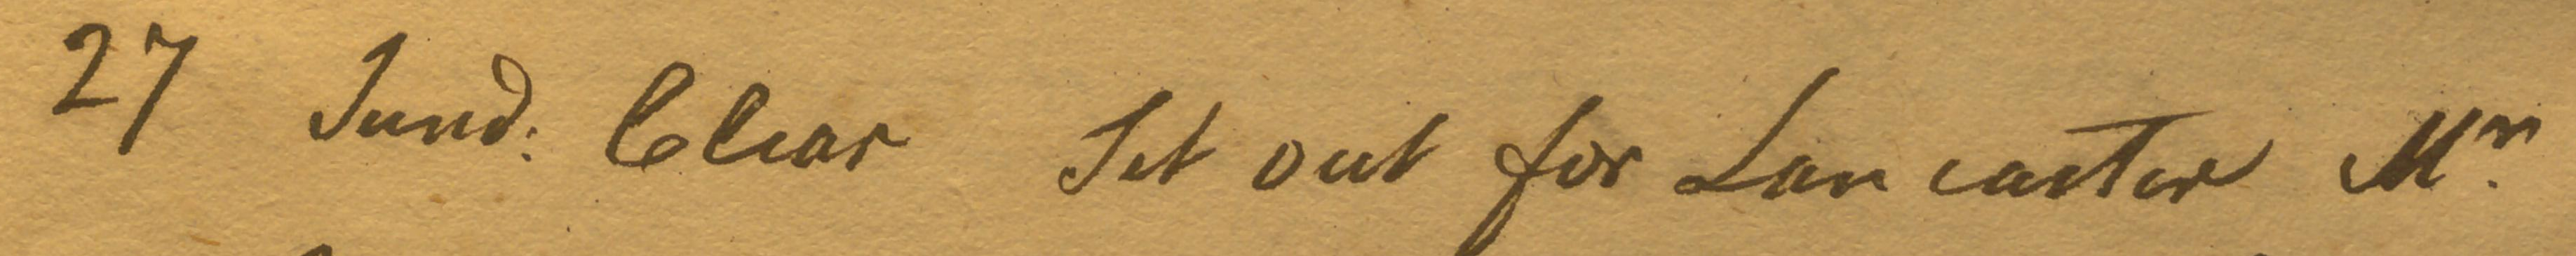27 Sund. Clear Set out for Lancaster M^r.
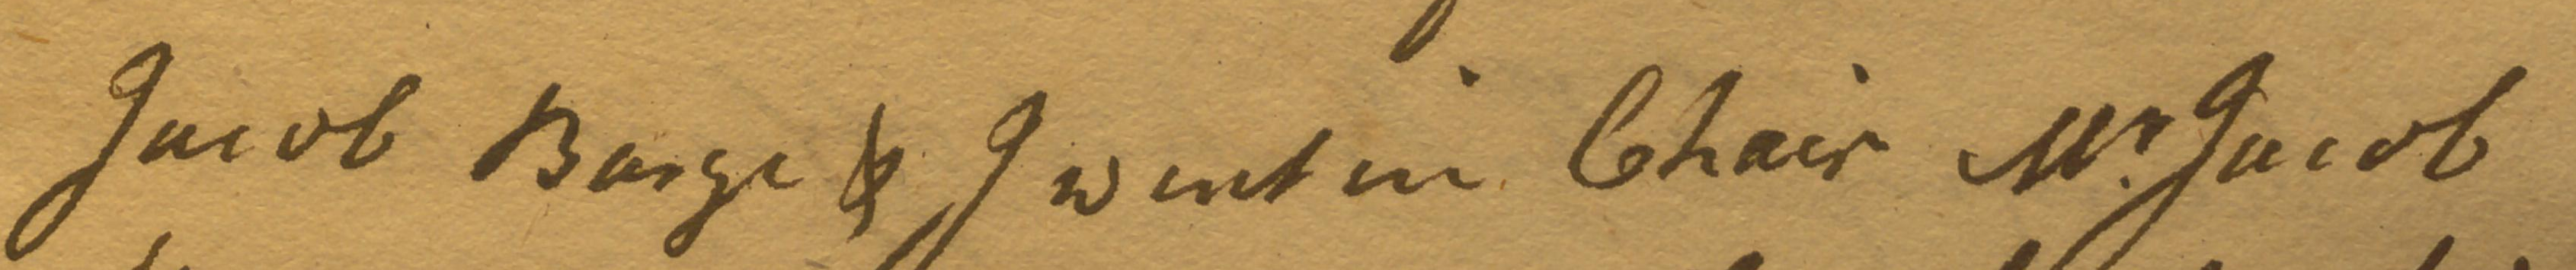Jacob Barge & I went in Chair M^r. Jacob
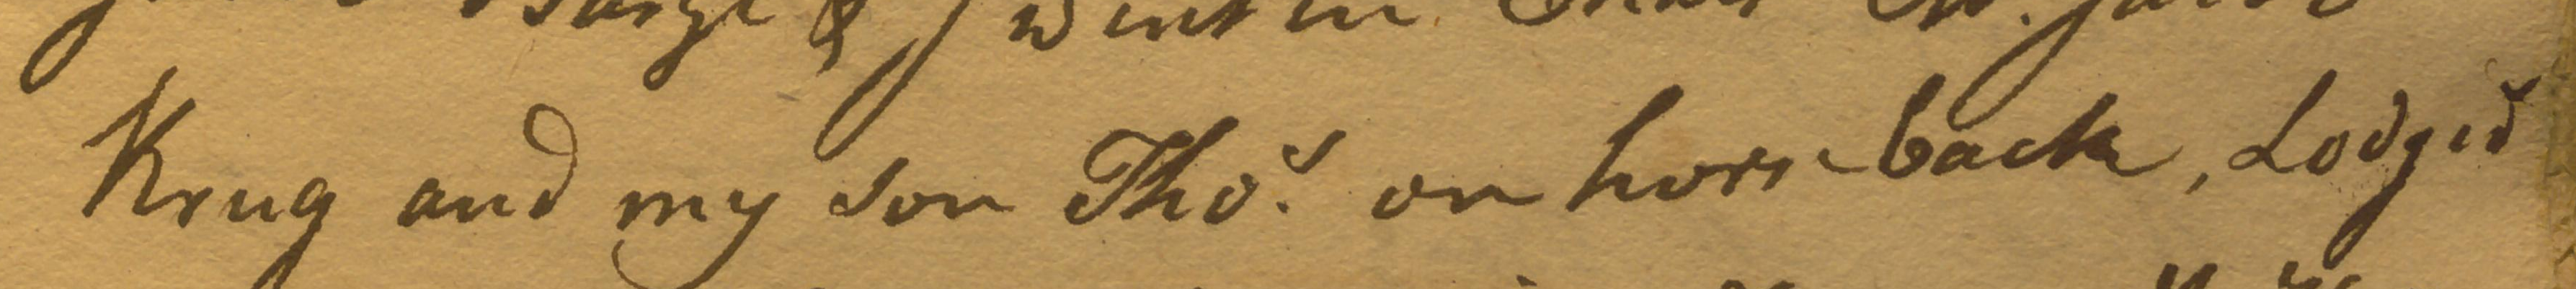Krug and my son Tho^s. on horseback, Lodged
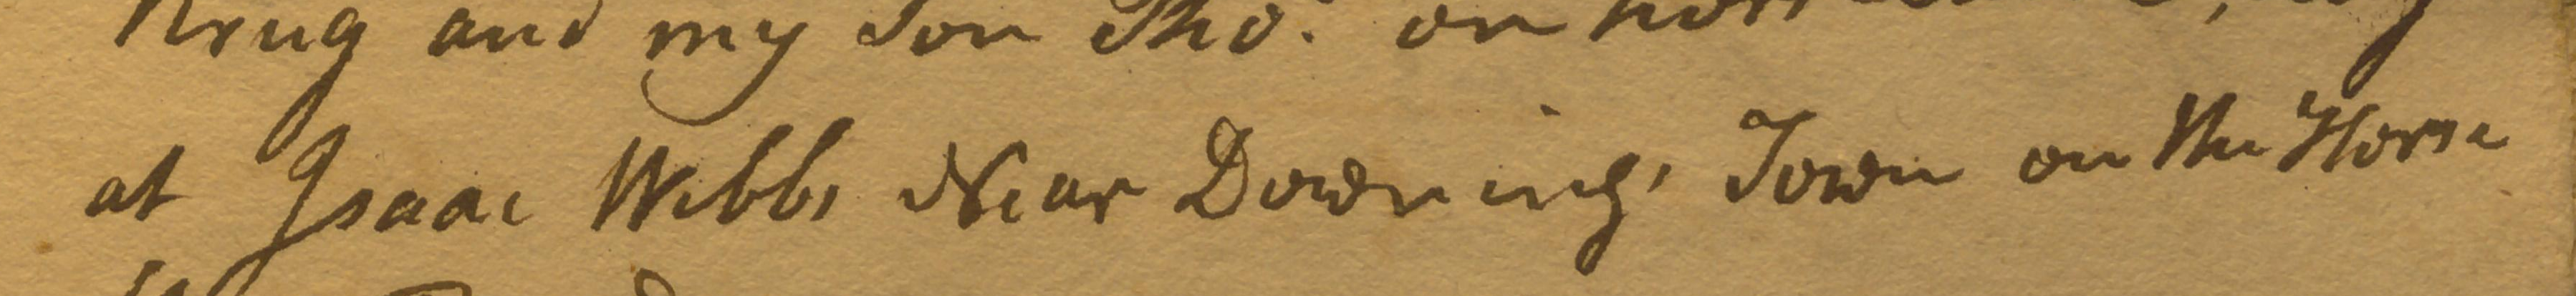at Isaac Webbs Near Downings Town on the Horse
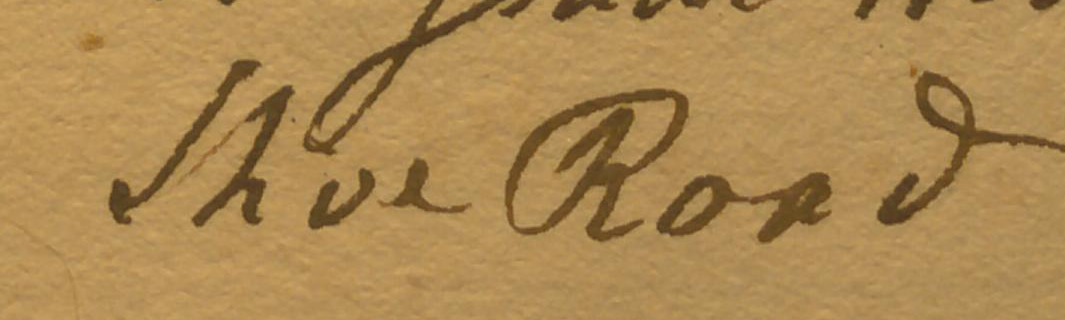Shoe Road
